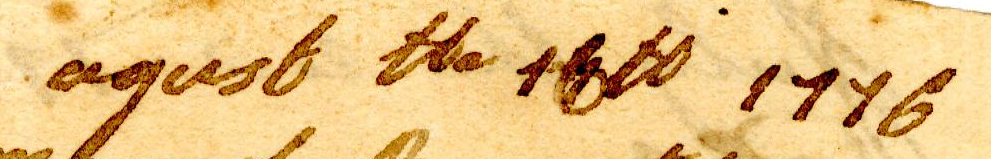agust the 19th 1776
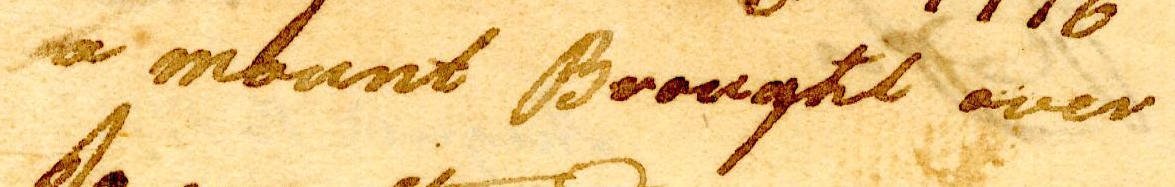a mount Brought over
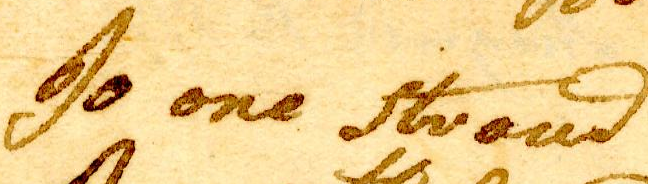To one stroud
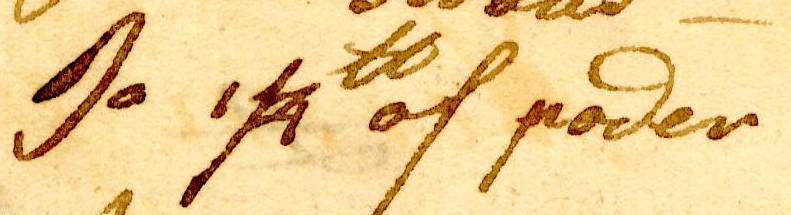To 1/4 ^lb of poder
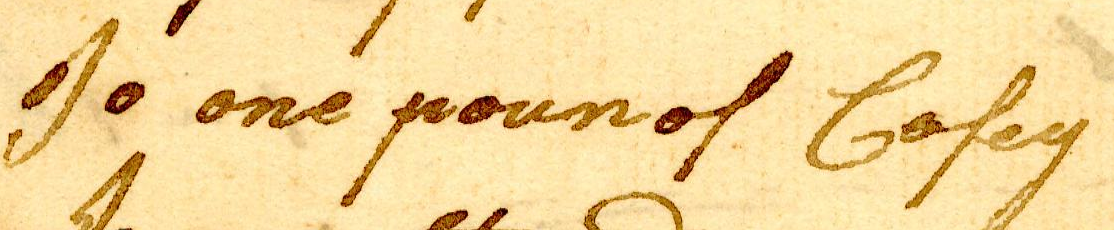To one poun of Cofey
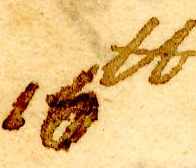16^th
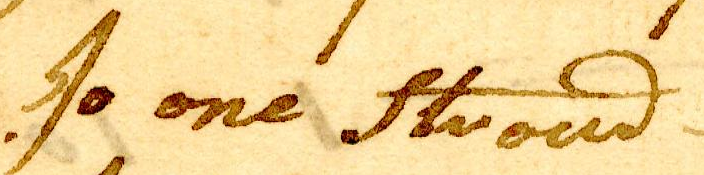To one Stroud
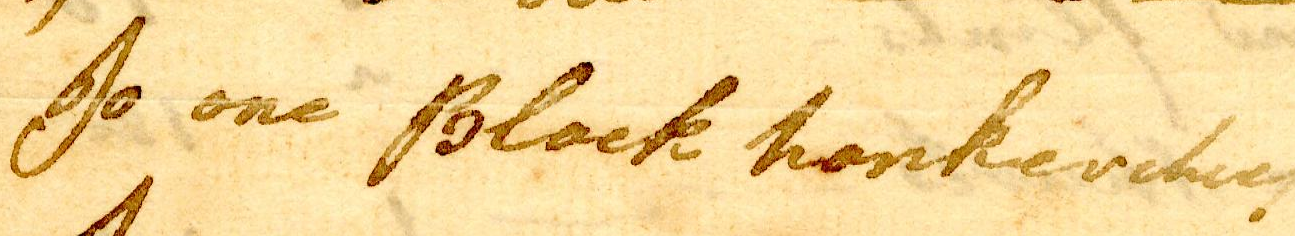To one Black hankerchief
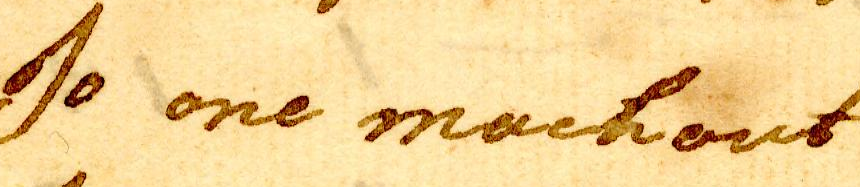To one machout
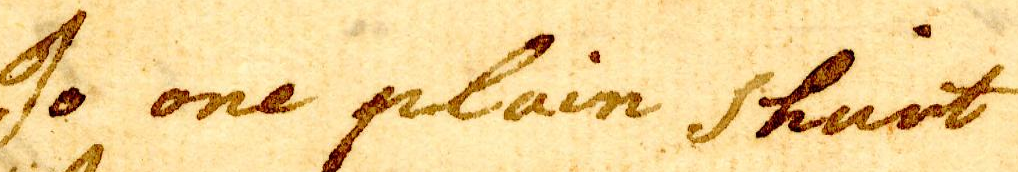To one plain shurt
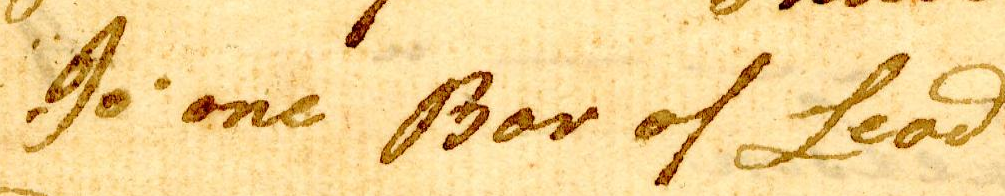To one Bar of Lead
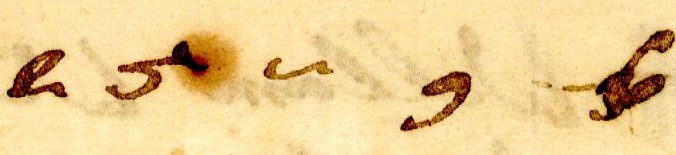25 - 9 - 6
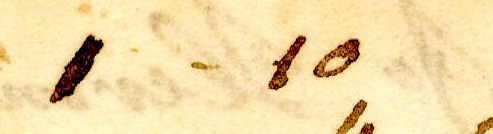1 - 10
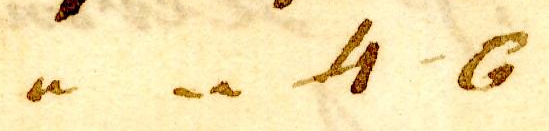- - 4 - 6
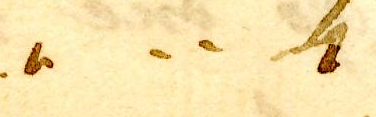- 4
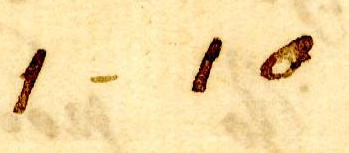1 - 10
